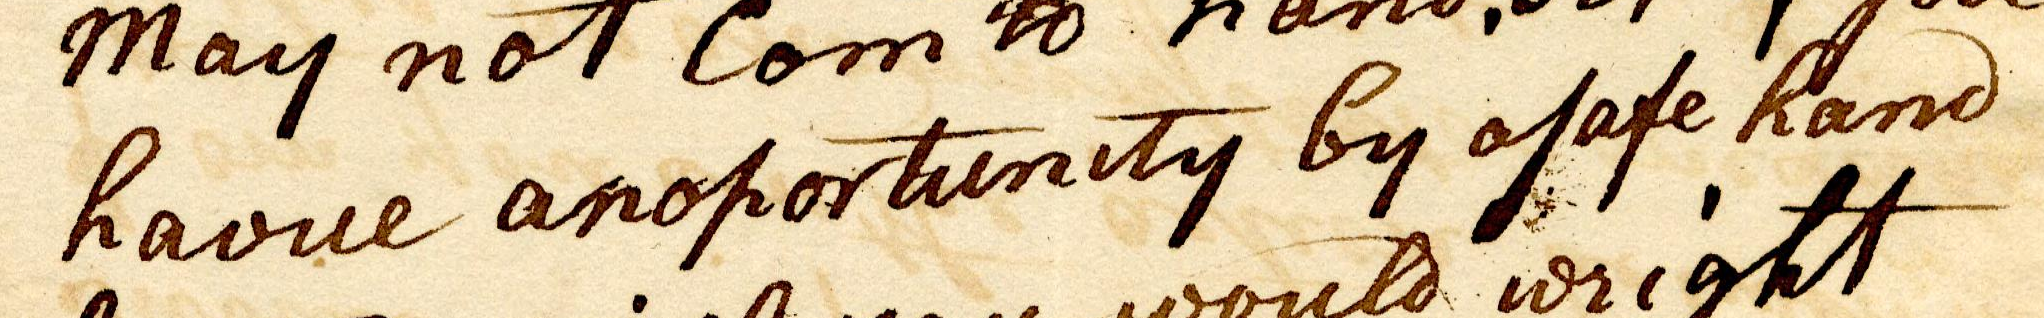havue an oportunity by a safe hand
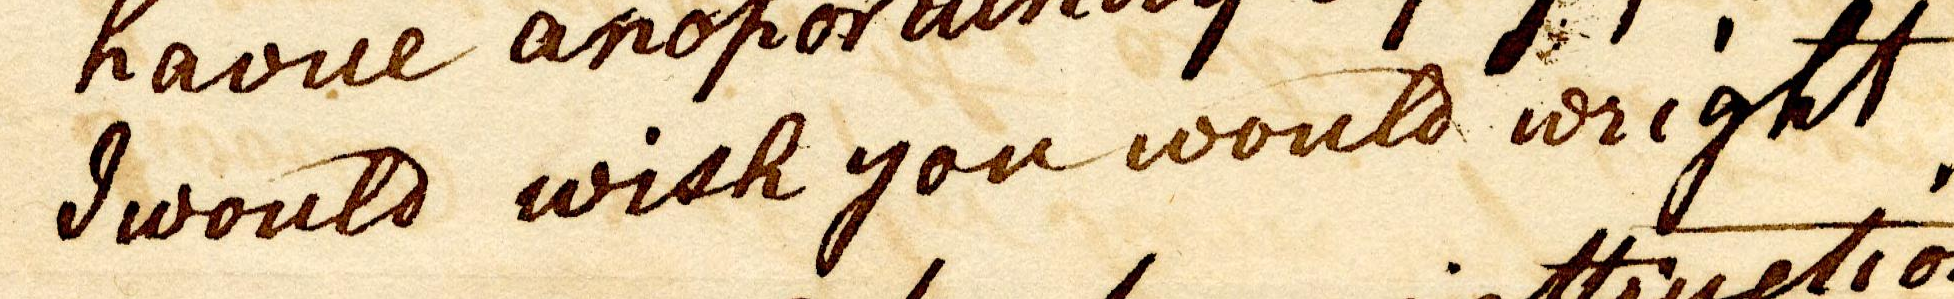I would wish you would wright
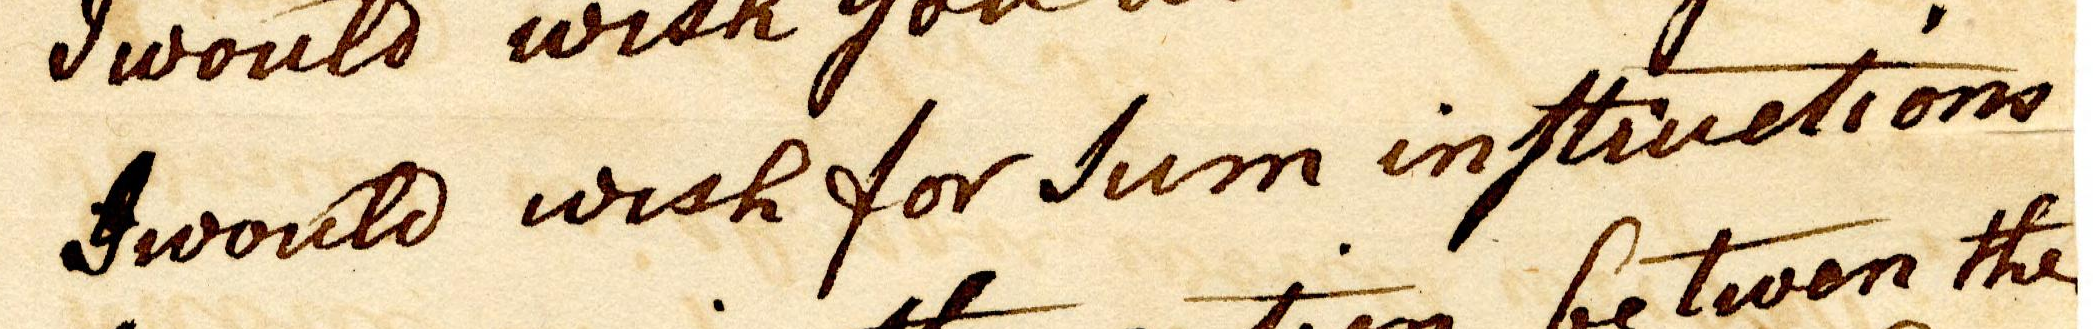I would wish for sum instructions
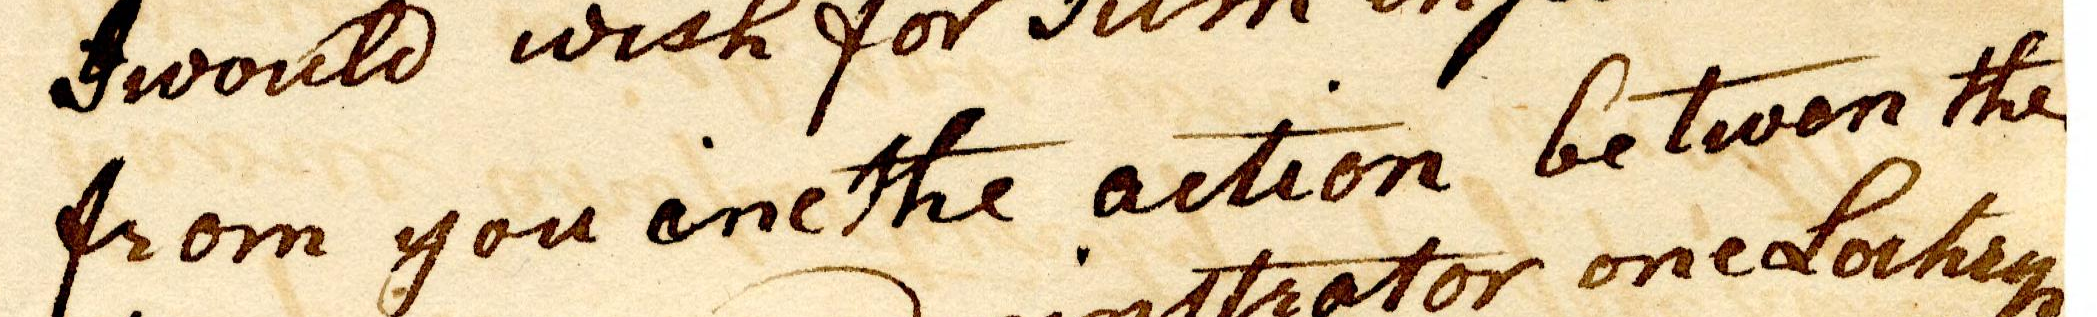from you ine the action betwen the
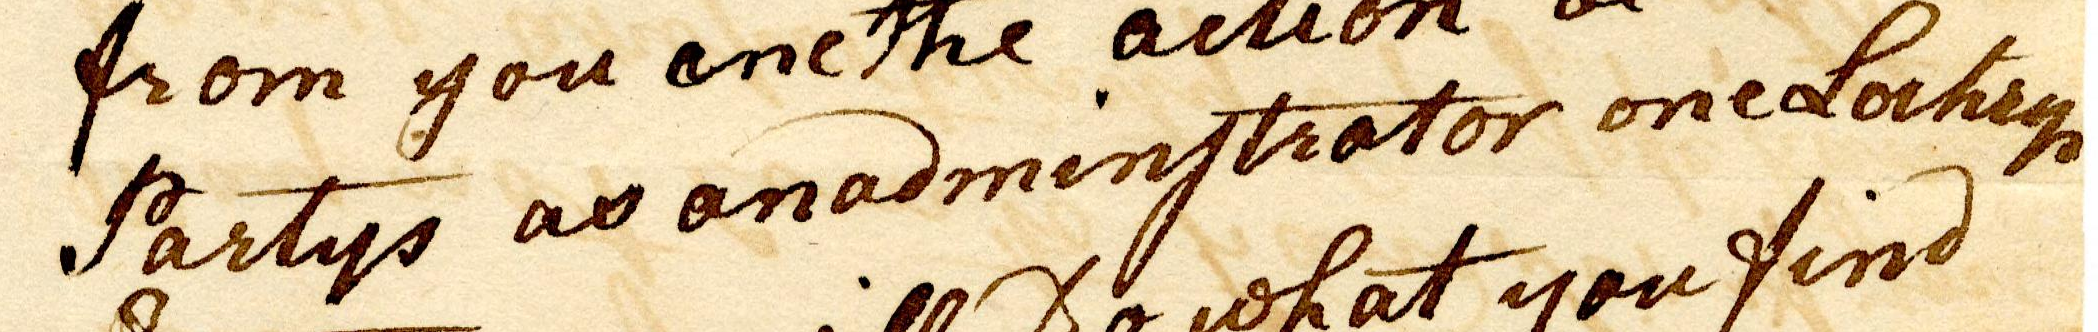Partys as an adminstrator one Lochry
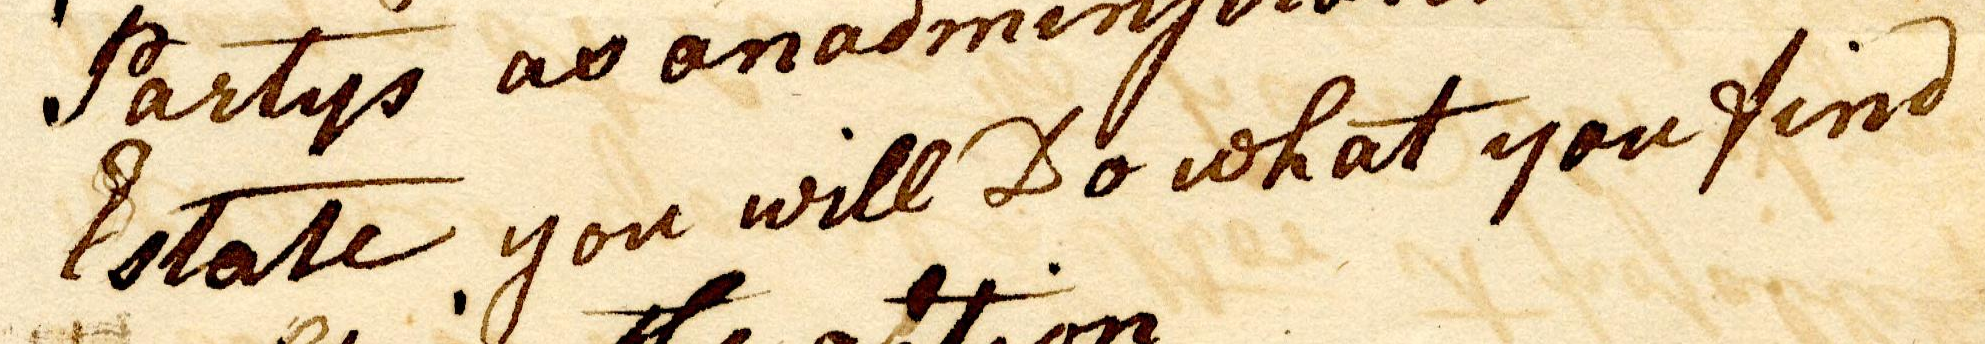Estate you will Do what you find
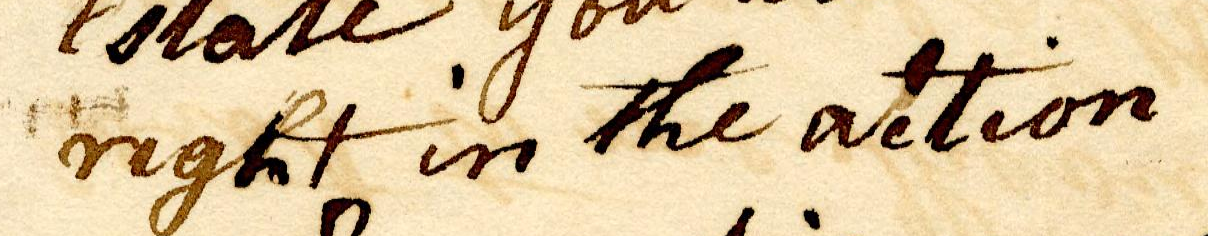right in the action
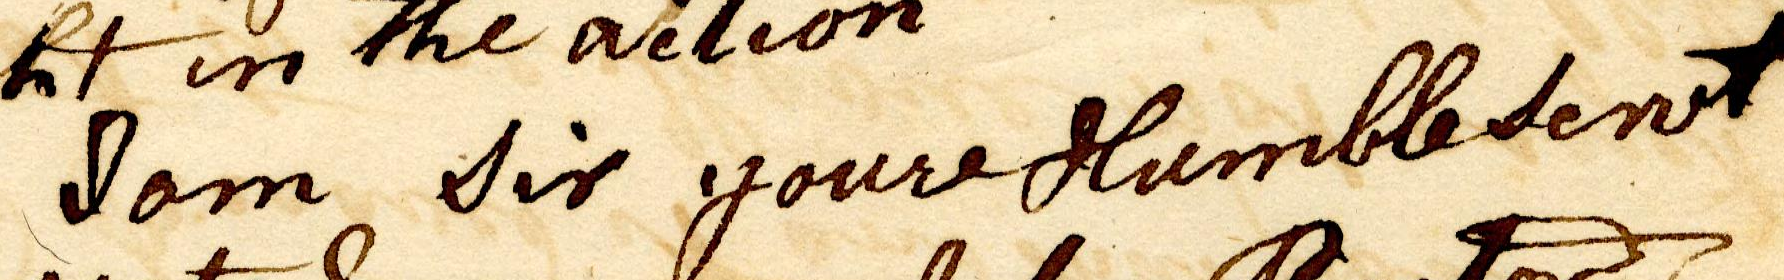I am sir youre Humble serv^t
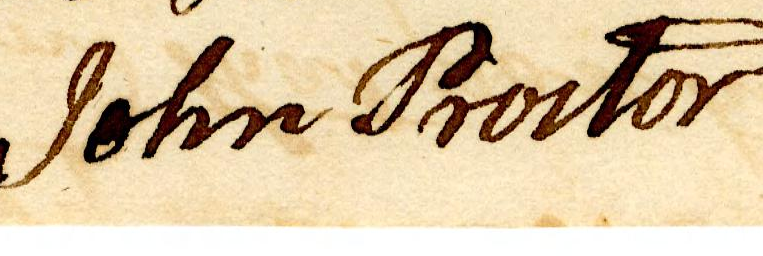John Proctor
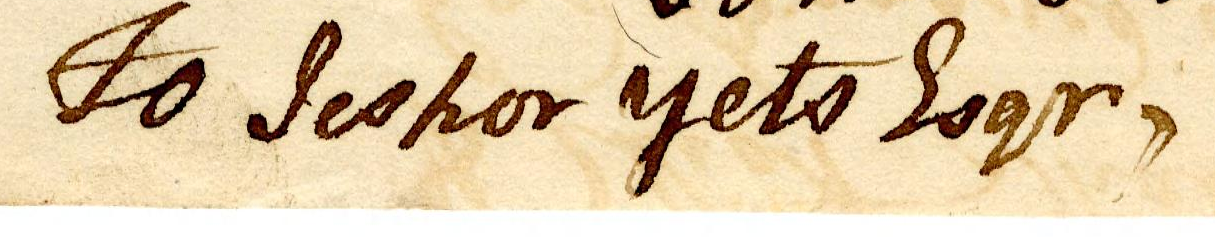To Jespor yets Esqr
